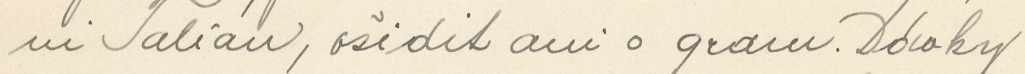ni Talián, ošidit ani o gram. Dávky
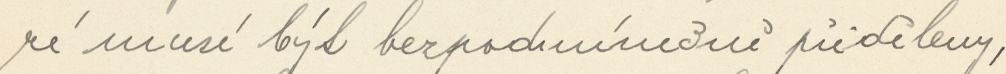ré musí být bezpodmínečně přiděleny,
